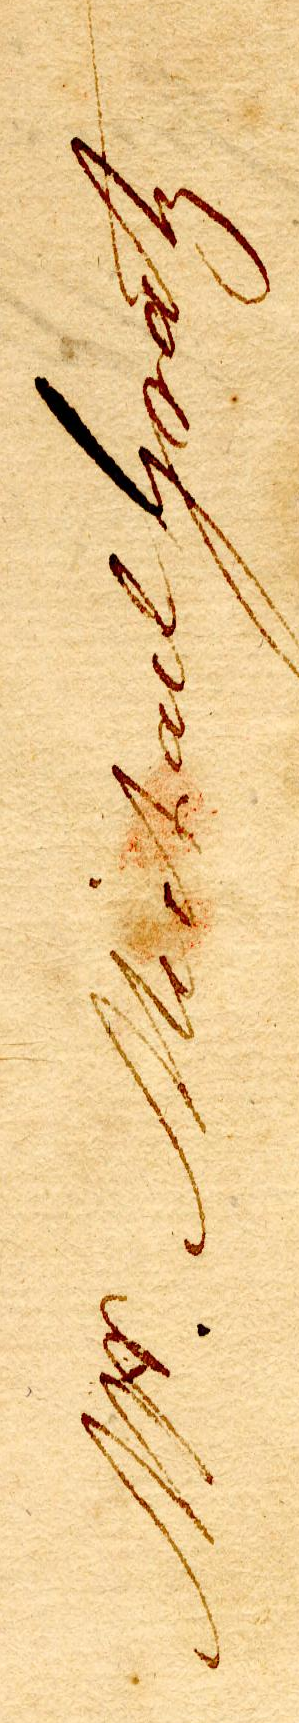M^r Michael Gratz
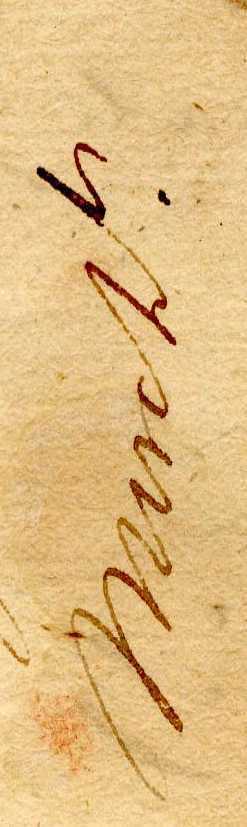Merch^t
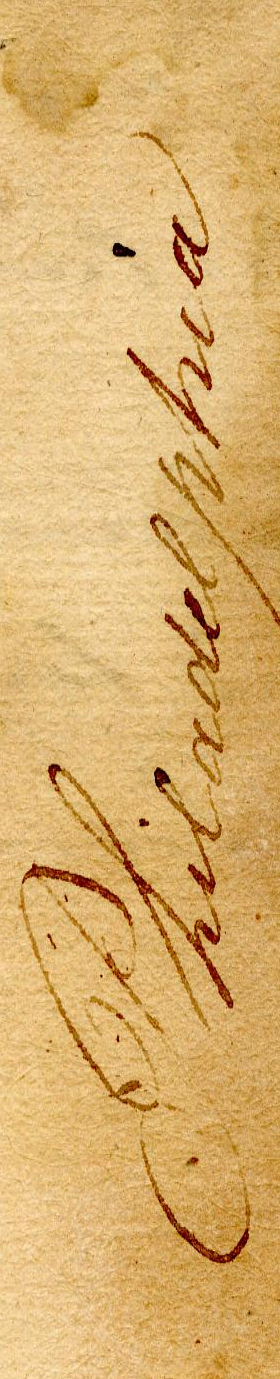Philadelphia
